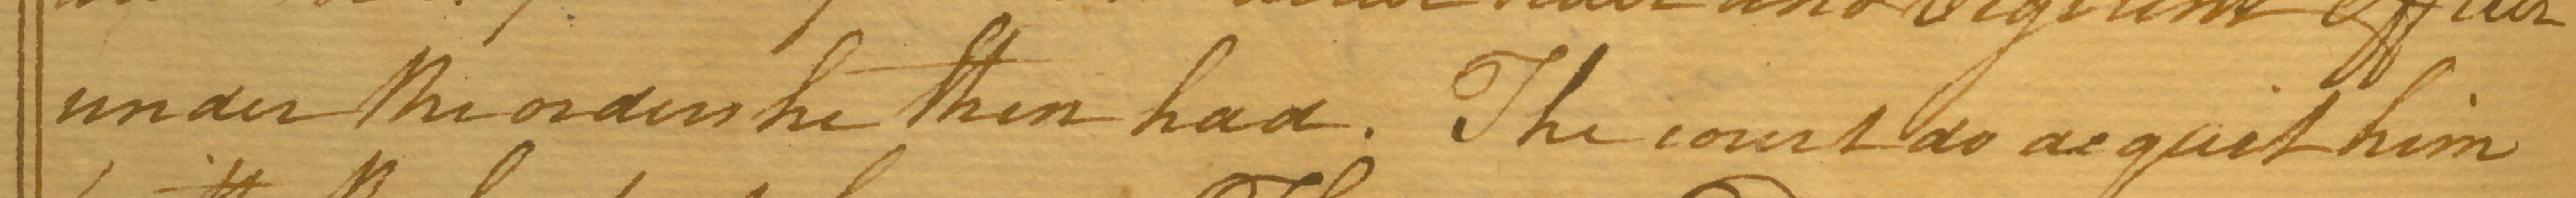under the orders he then had. The court do acquit him
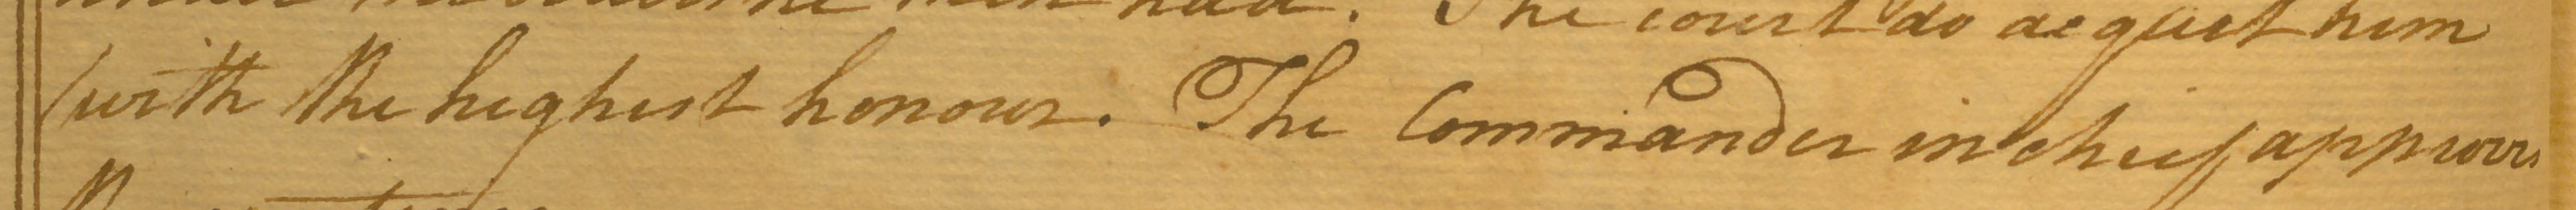with the highest honour. The Commander in chief approves
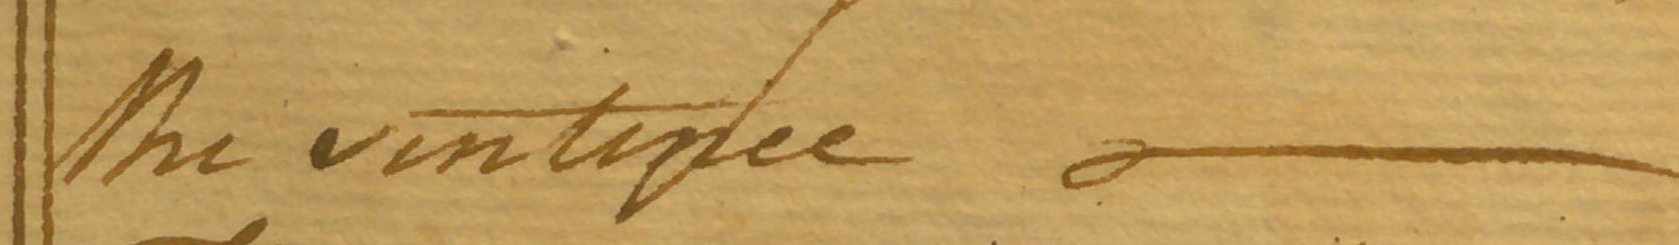the sentence-
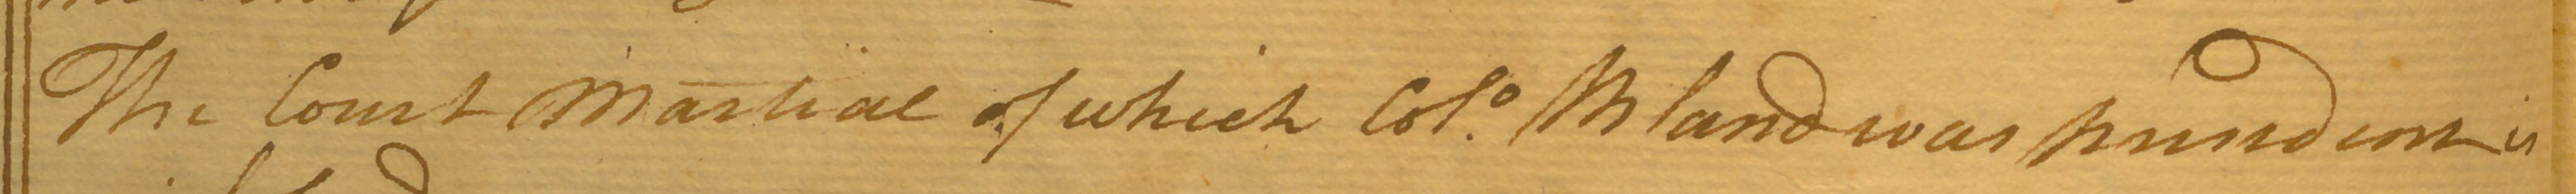The Court Martial of which Col^o. Bland was president is
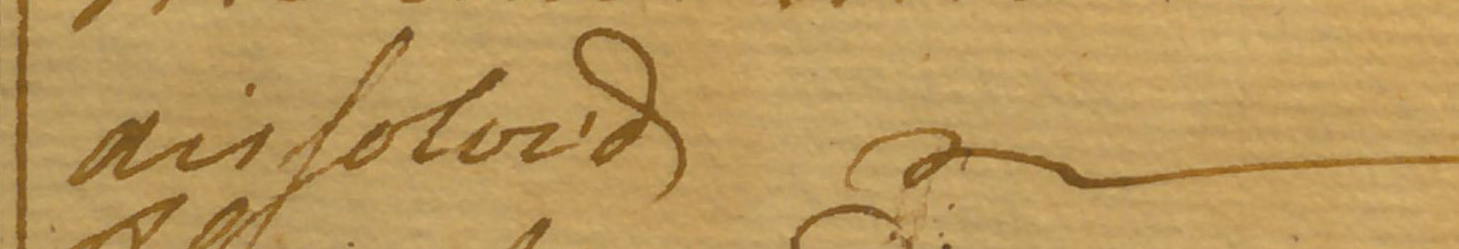dissolv'd-
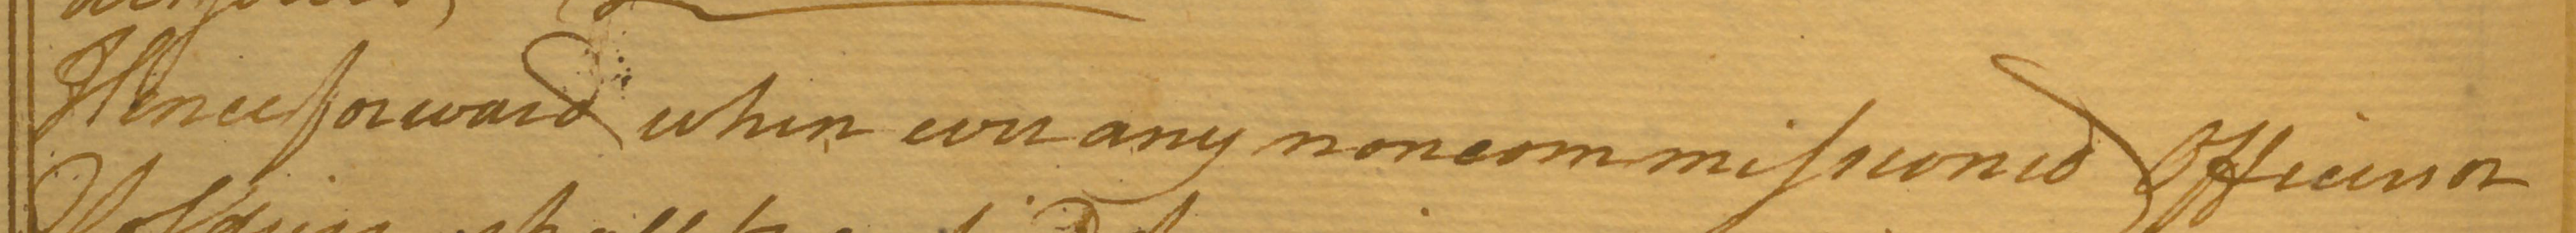Henceforward when ever any noncommissioned Officer or
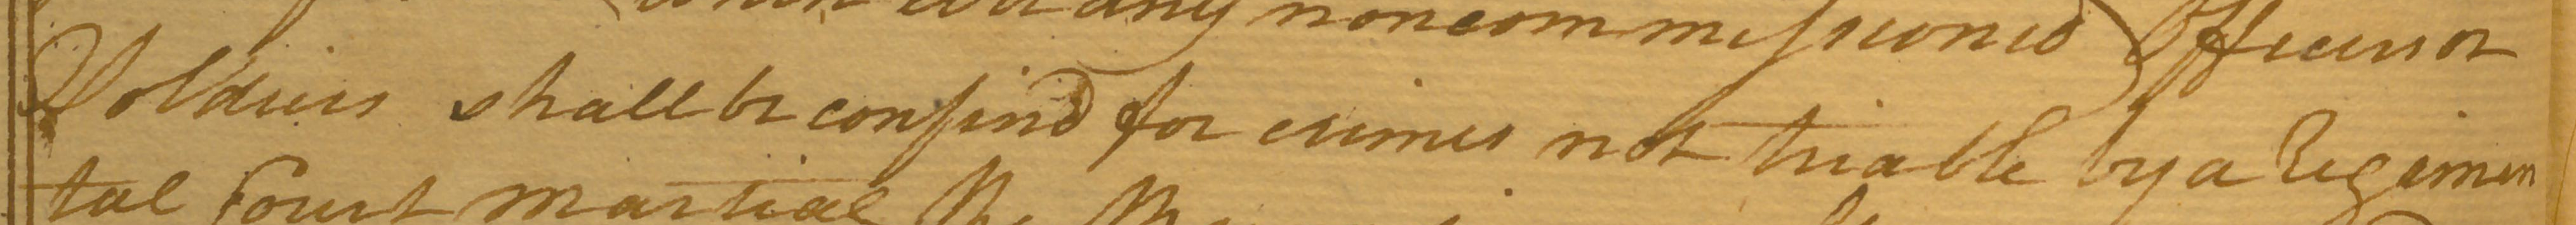Soldiers shallbe confin'd for crimes not triable by a regimen
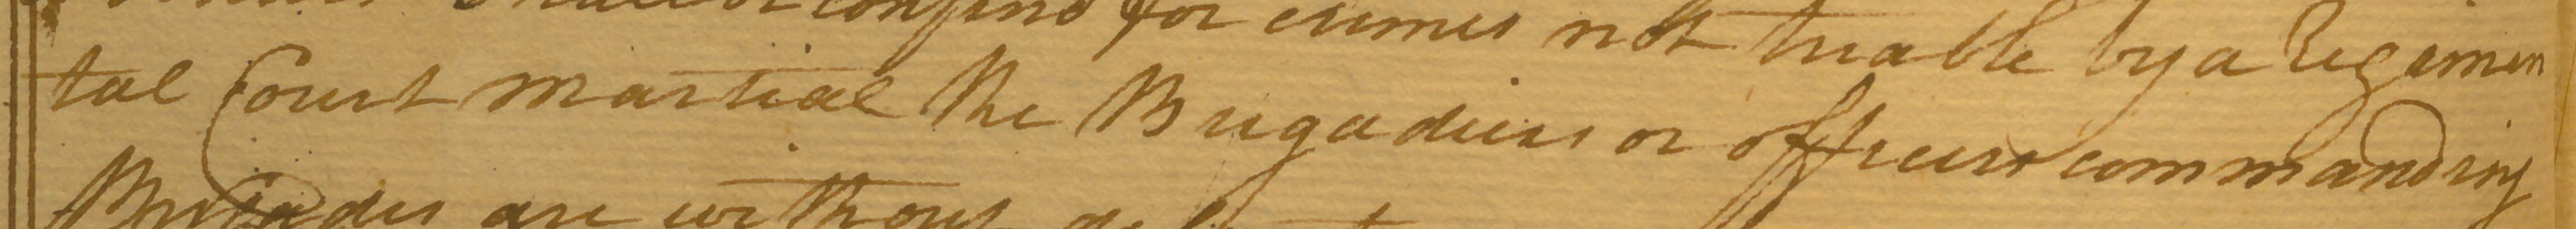tal Court martial the Brigadiers or officers commanding
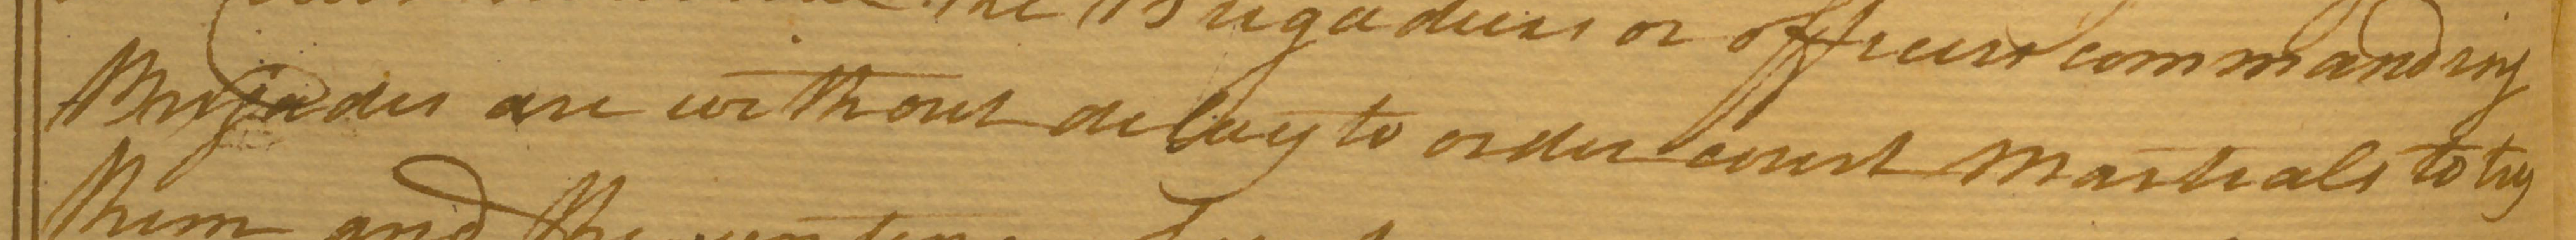Brigades are without delay to order court martials to try
